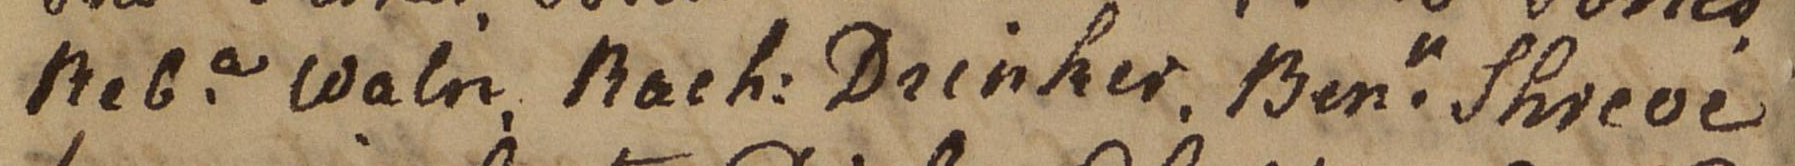Reb^a Waln, Rach: Drinker, Ben^n. Shreve
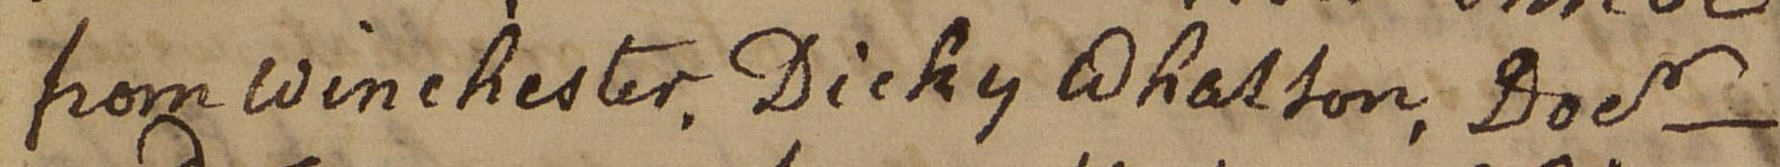from Winchester, Dicky Whatton, Doc^r-
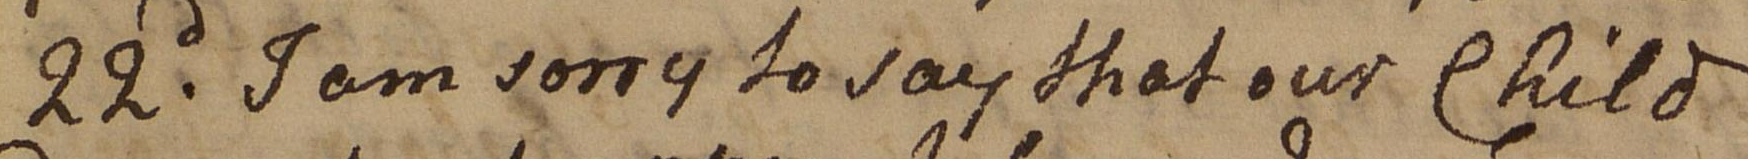22^d. I am sorry to say that our Child
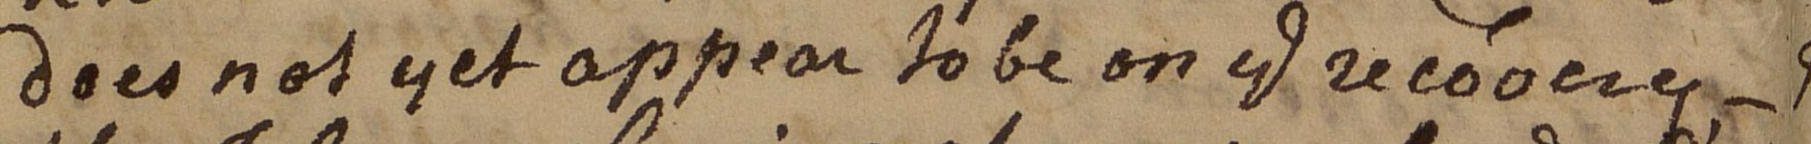does not yet appear to be on y^e recovery-
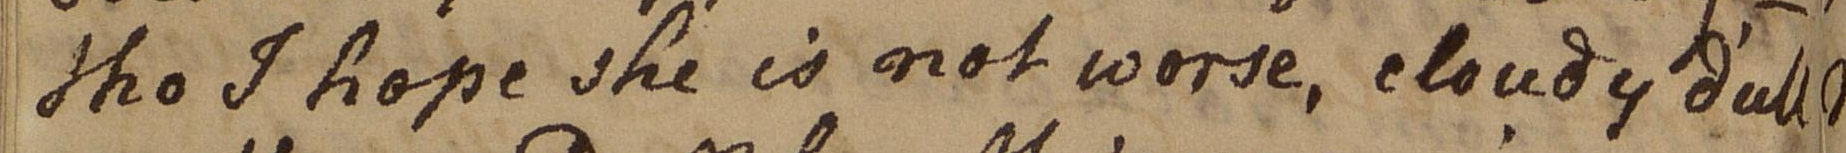tho I hope she is not worse, cloudy dull
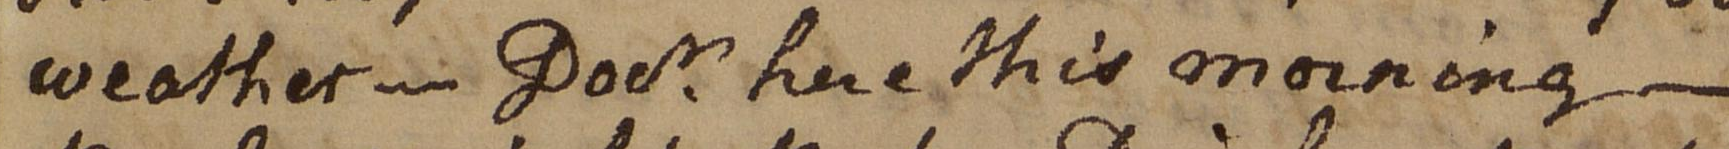weather- Doc.^r here this morning-
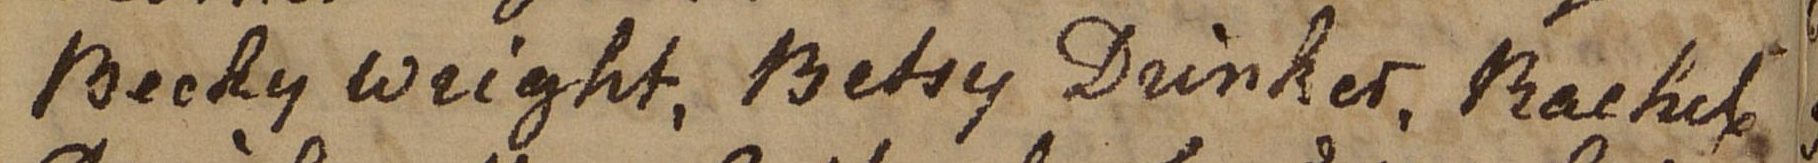Becky Wright, Betsy Drinker, Rachel
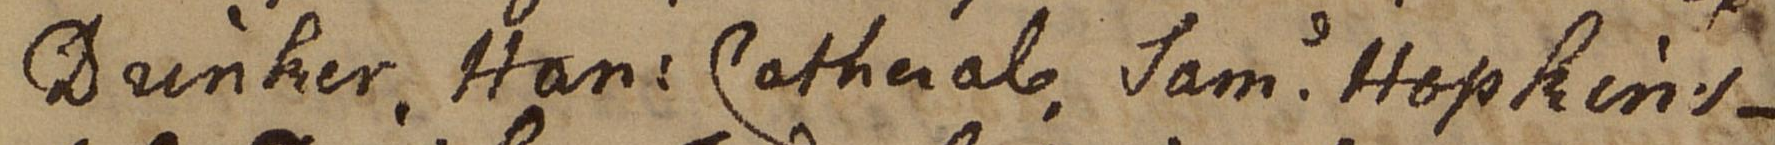Drinker, Han: Catheral, Sam.^l Hopkins-
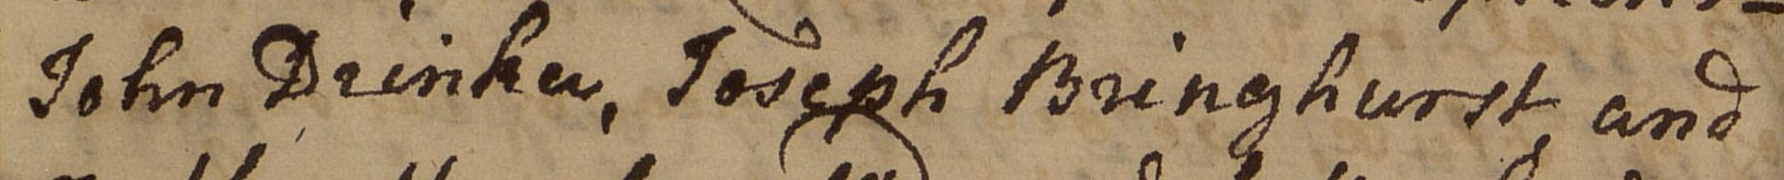John Drinker, Joseph Bringhurst, and
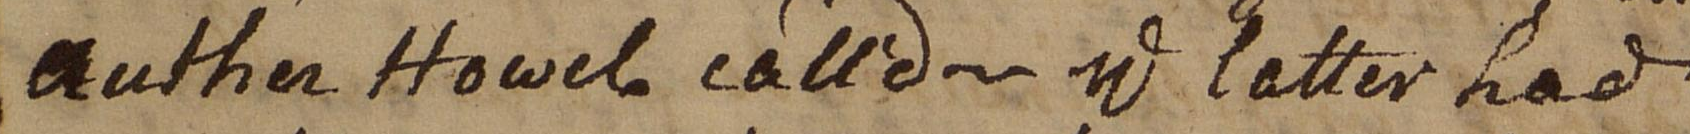Auther Howel call'd- y^e latter had
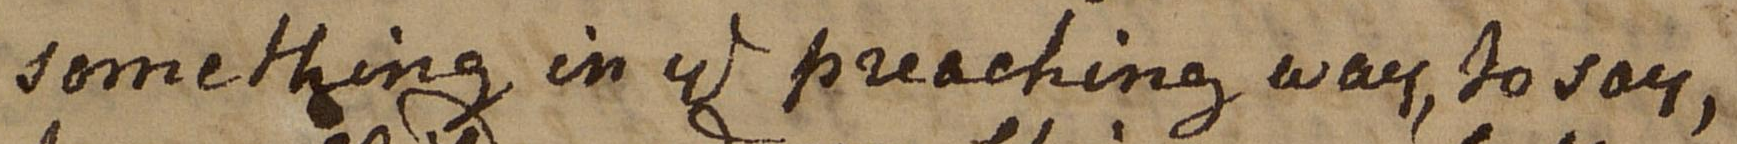something in y^e preaching way, to say,
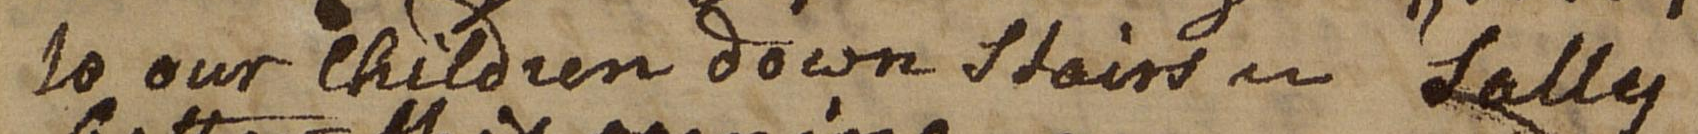to our children down Stairs- Sally
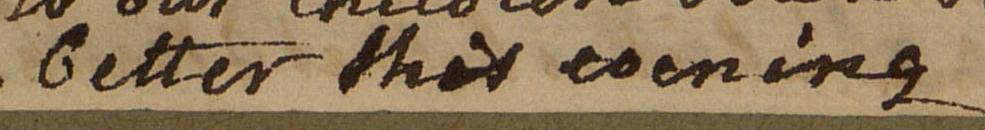better this evening
